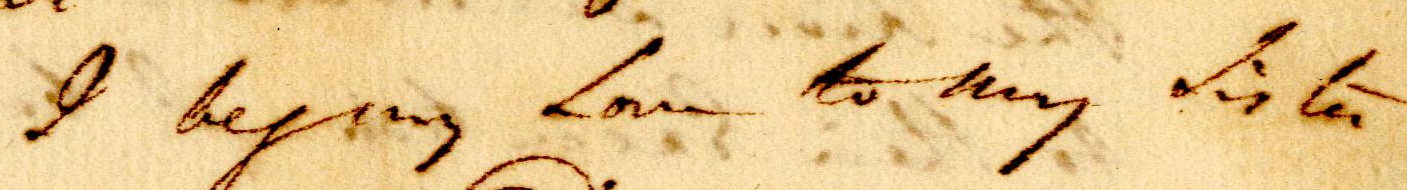I beg my Love to my Sister
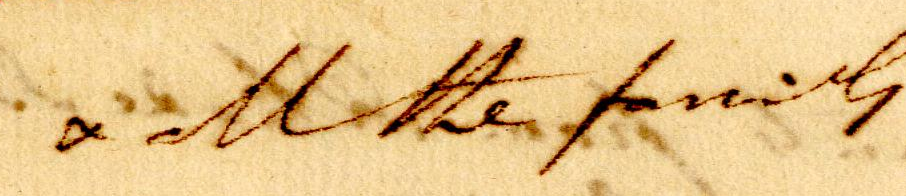& all the family
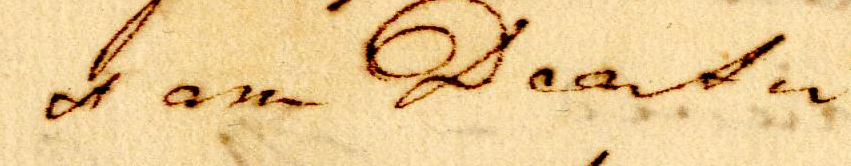I am Dear Sir
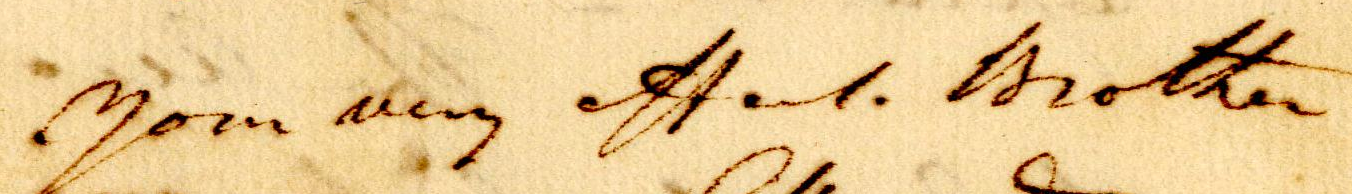your very affect. Brother
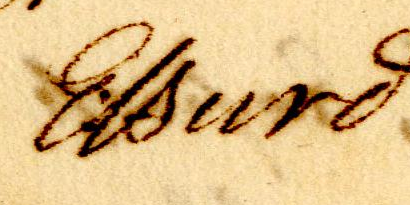E. Burd
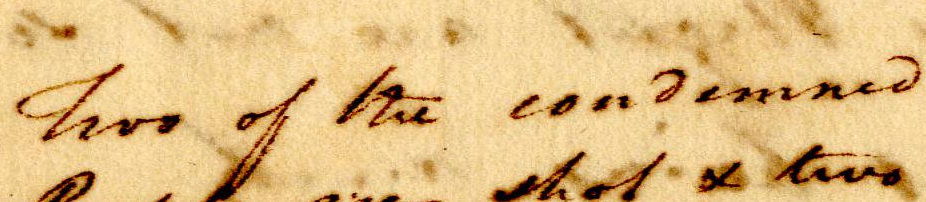Two of the condemned
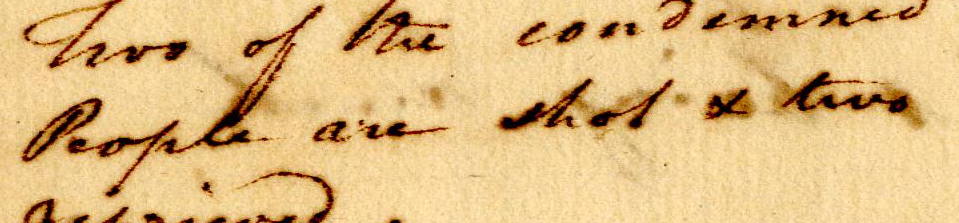People are shot & two
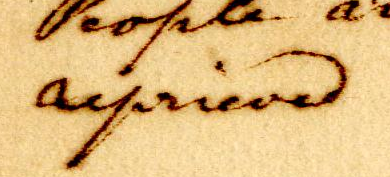reprieved.
